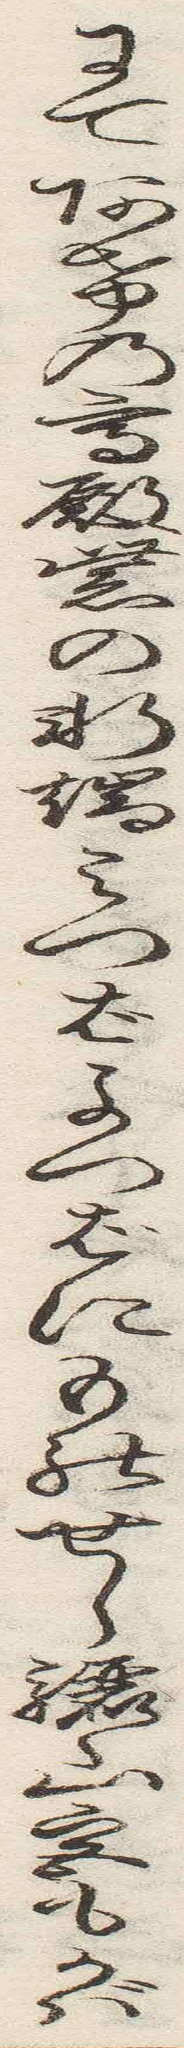にてあけの高殿紫の軒端みつばよつばにものせし驪山宮もかば
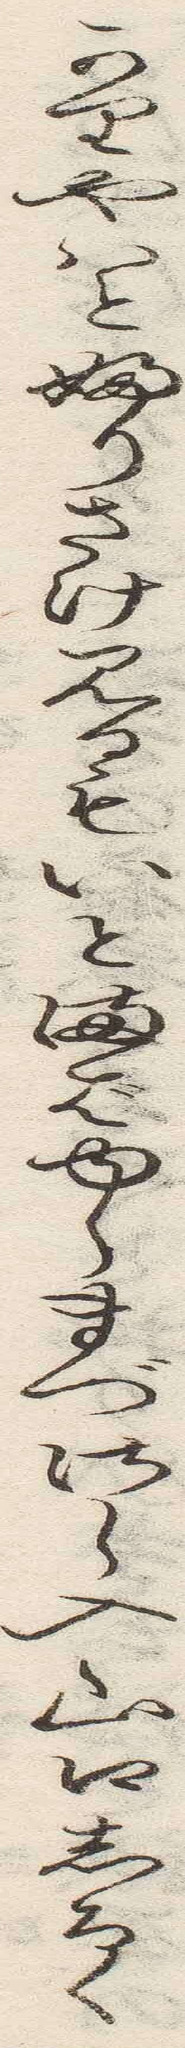かりやはとふりさけ見るもいとまばゆしまづさし入山口しろく
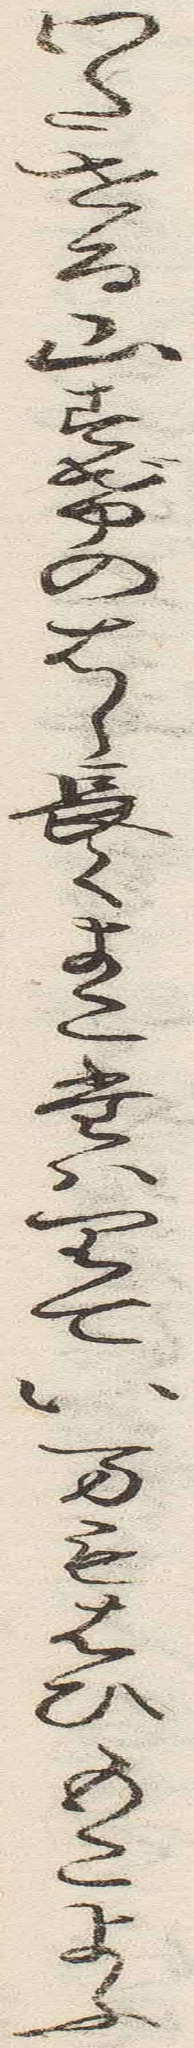わたせる山すげのはし長くよこたはりていまもはひもこよふ
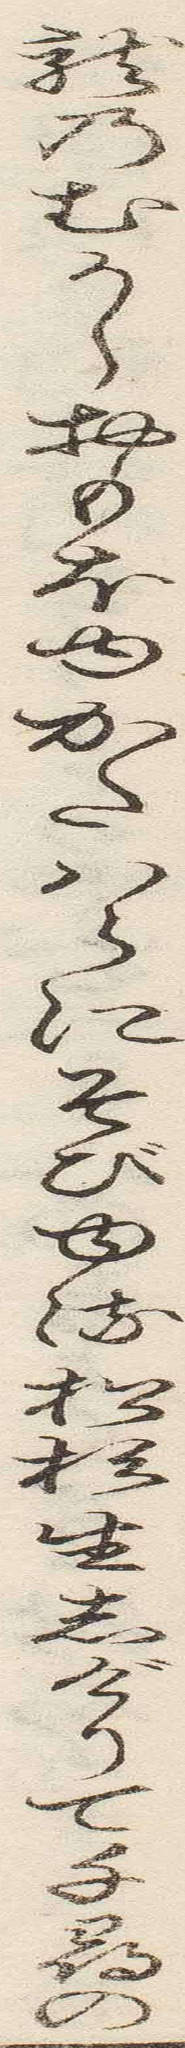龍のむかしおもほゆかたはらにそびゆる松杉生しげりて千尋の
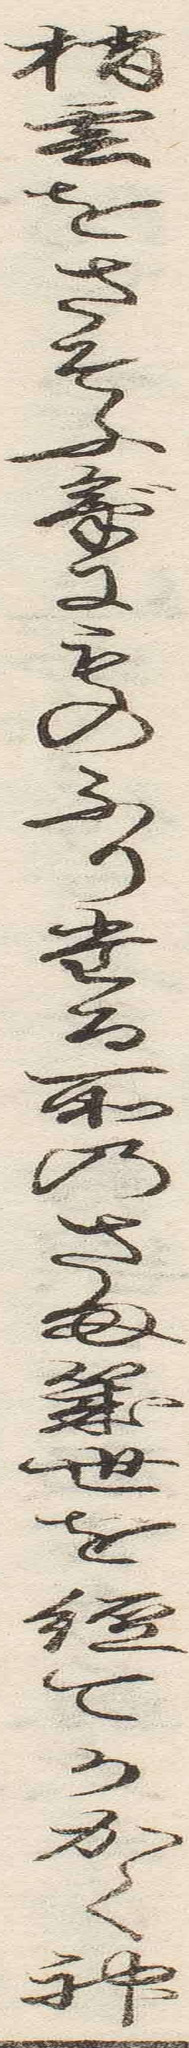梢雲をさそふげにものふりたる所のさま幾世を經てかかく神
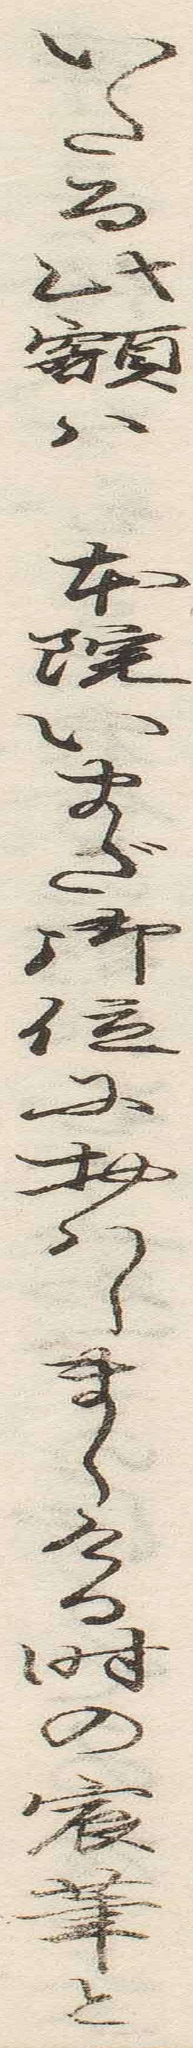いたる此額は本院いまだ御位におはしましける时の宸筆と
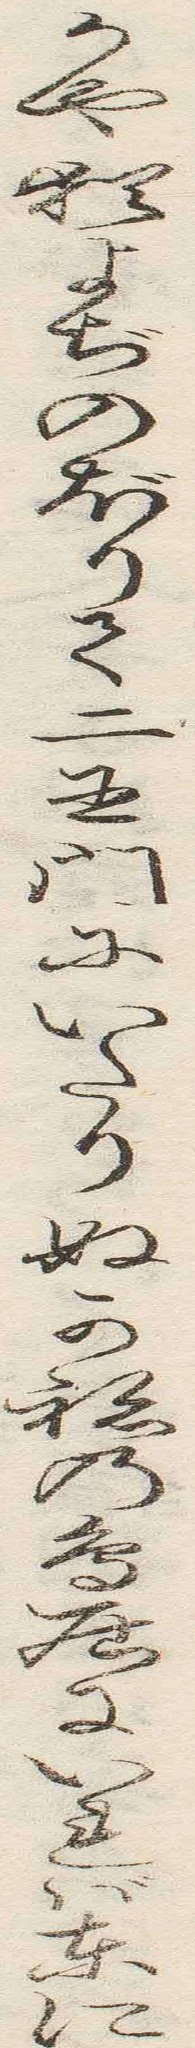かや猶よぢのぼりて二王門にいたりぬかねの鳥居にいれば東に
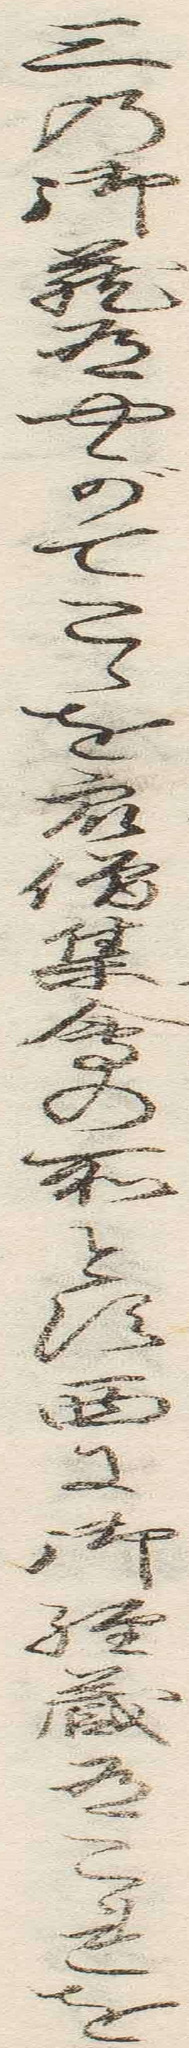三の御蔵有やがてこゝを衆僧集會の所とす西に御經蔵有これを
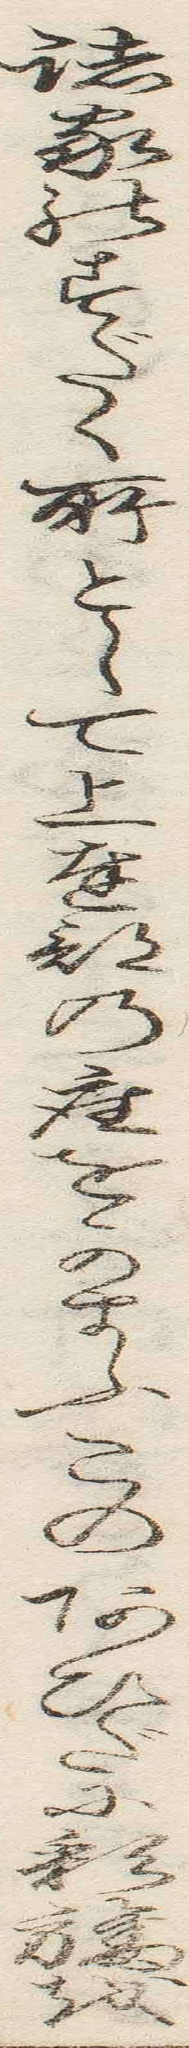諸家のすだく所として上達部の座をかまふこのあひだに彩旙を
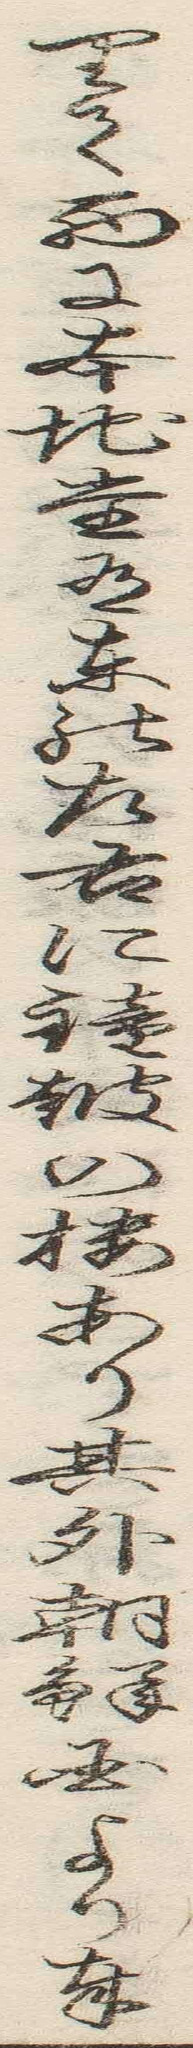りて西に本地堂有東の左右に鍾皷の楼あり其外朝鮮国より奉
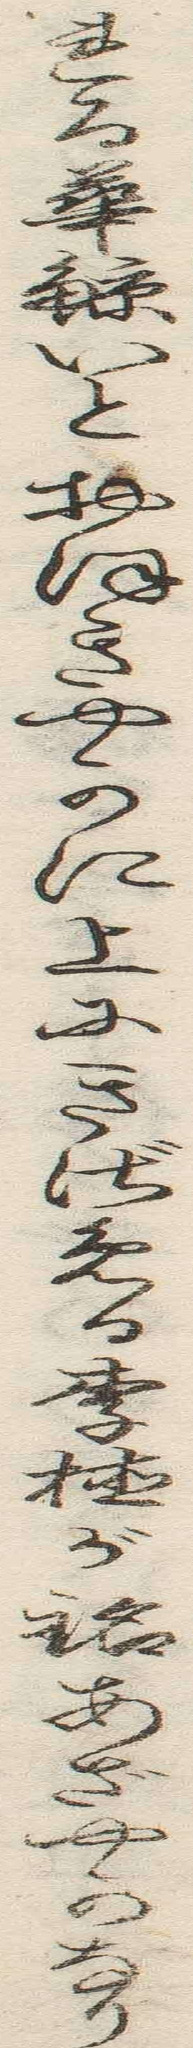れる蕐鯨いとおほきやかに上にきざめる李植が銘あざやかなり
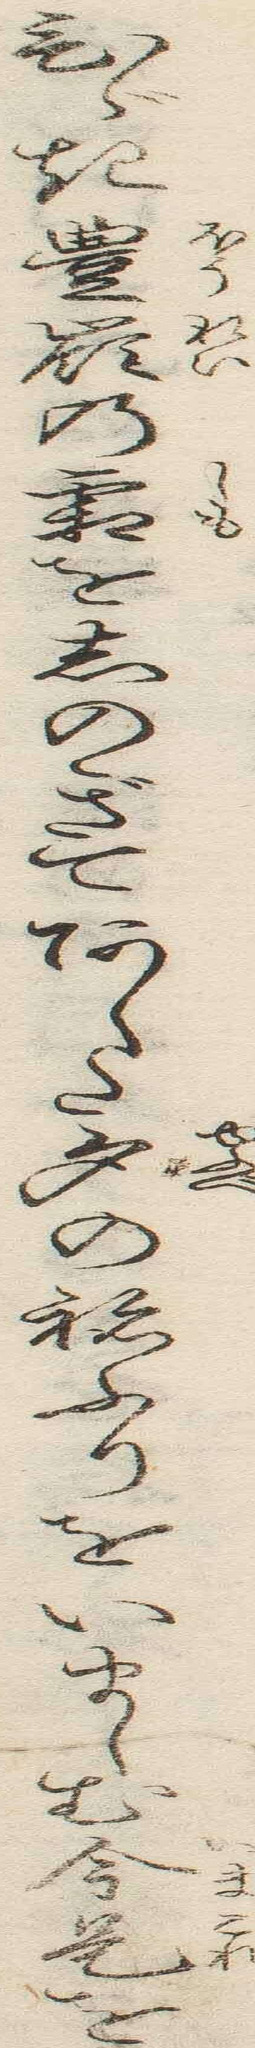ひゞき豊嶺の霜をしのぎてあした夕のねふりをいましむ今是を
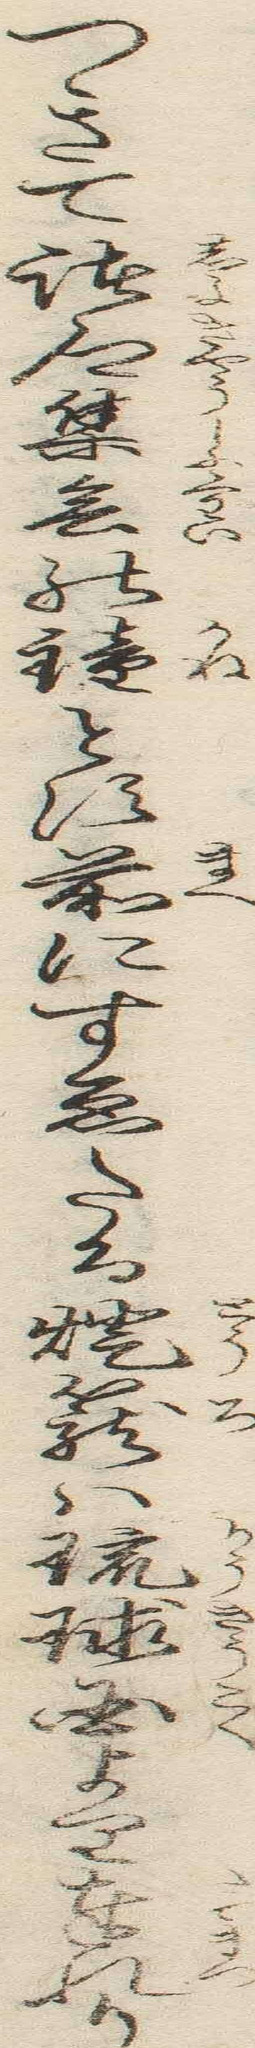つきて諸卿集会の鐘とす前にすゑたる燈籠は琉球国より奉れり

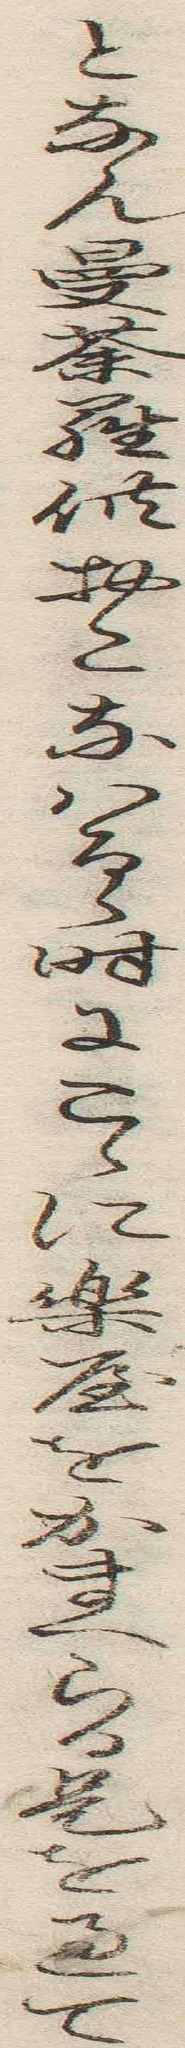となん曼荼羅供おこなはるゝ时にこゝに樂屋をかまへらる是を過て
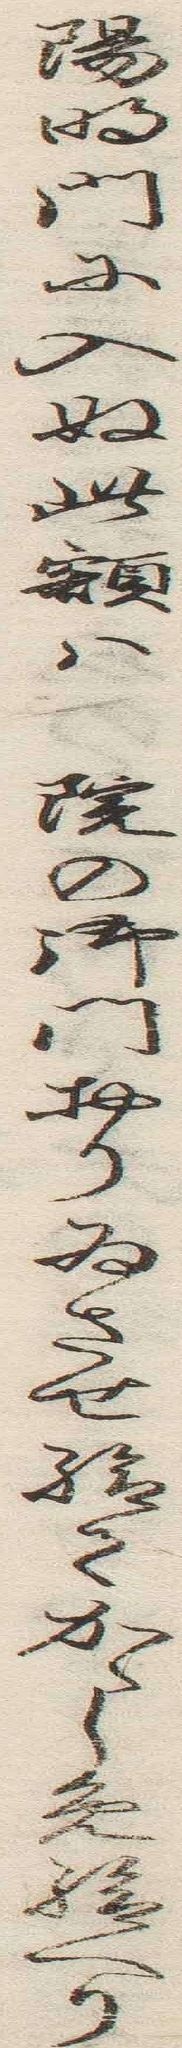陽明門に入ぬ此額は院の御門おりゐさせ給てかゝしめ給へり
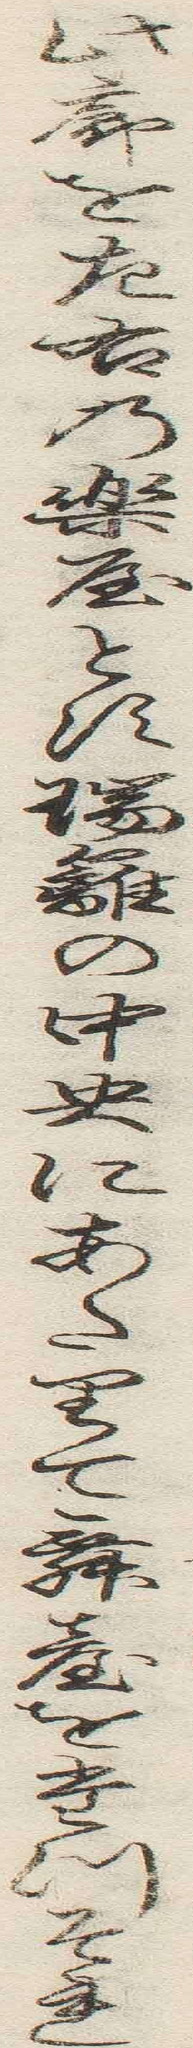此廊を左右の樂屋とす瑞籬の中央にあたりて舞臺をたつそれ
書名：日光山志
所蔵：東京学芸大学附属図書館 国文学研究資料館
